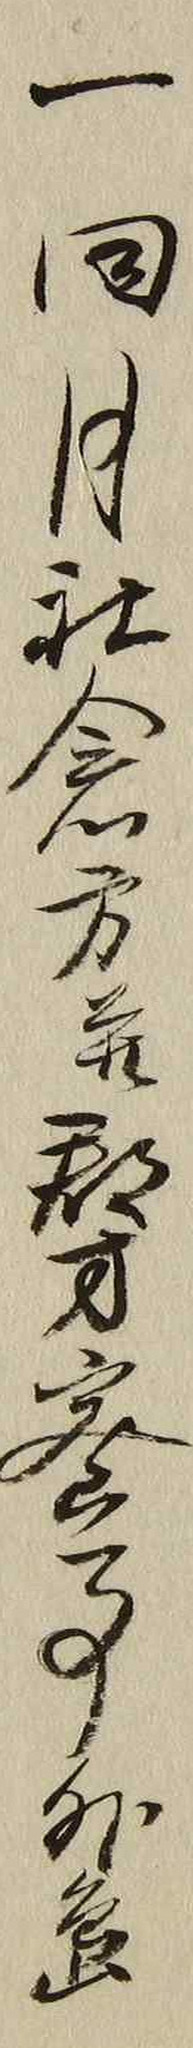一同月社倉方并郡方密事外島
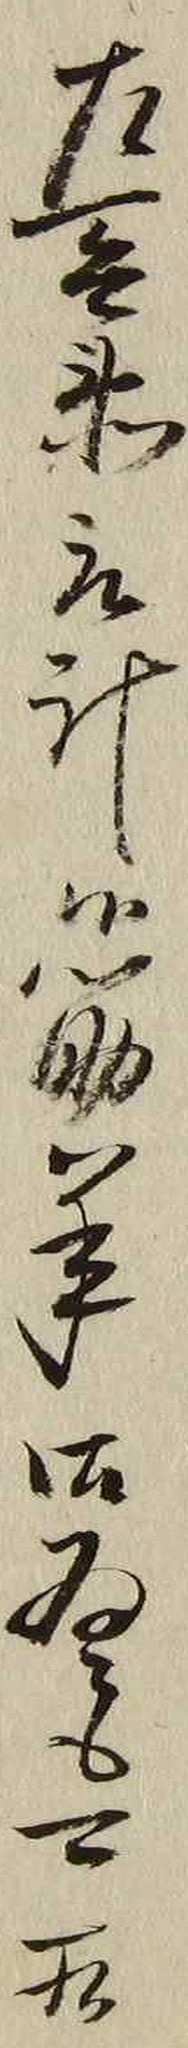左一兵衛取計候筋承御為ニも可相
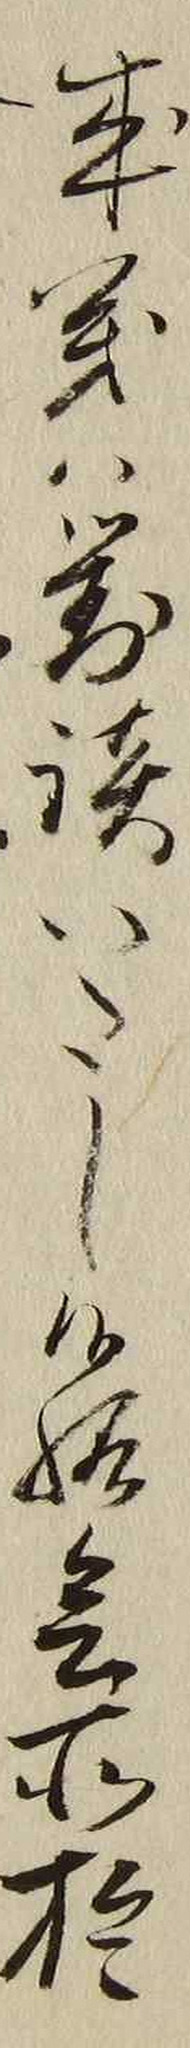成義ハ対談いたし候様会所於
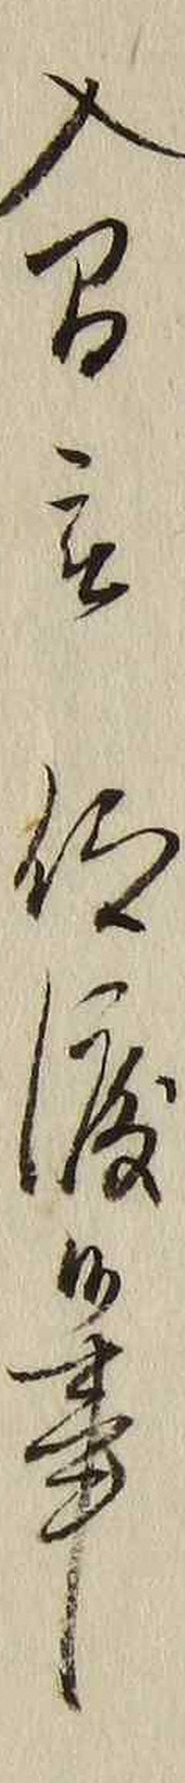入間被仰渡候事
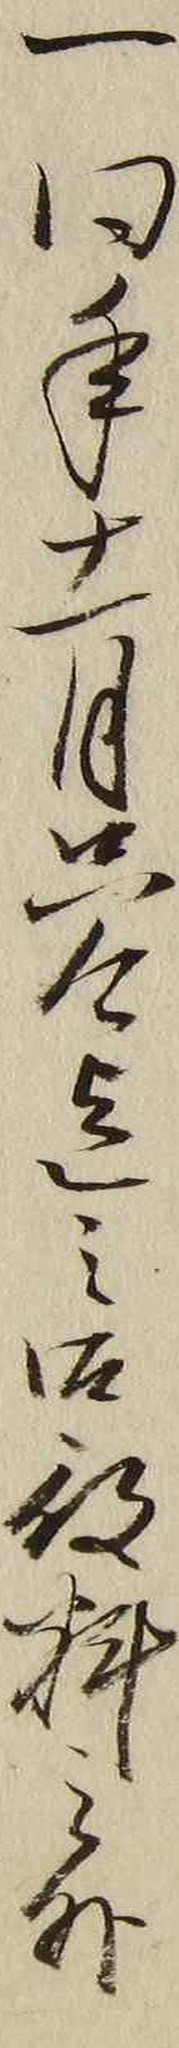一同年十一月只今迄之御役料之外
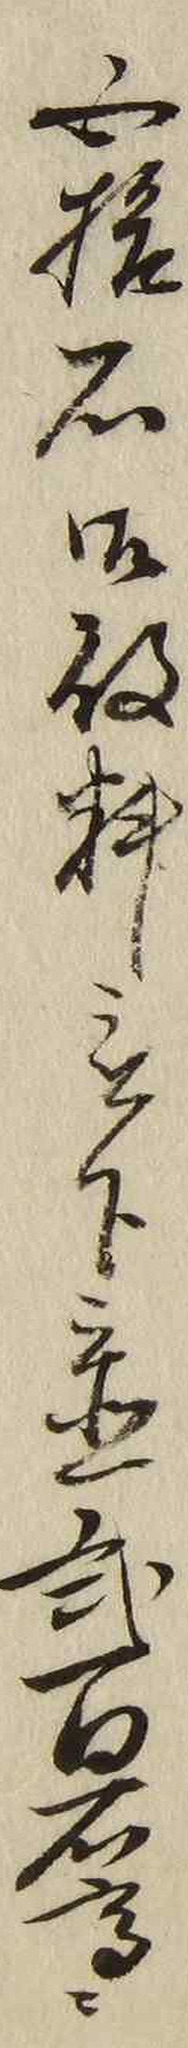五拾石御役料被下置弐百石高ニ

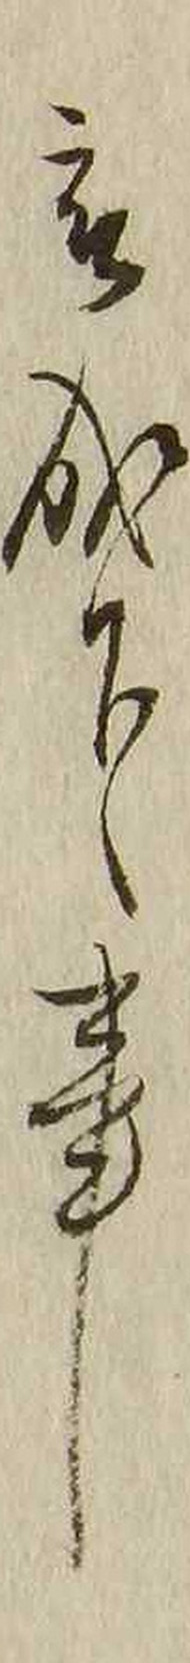被成下候事
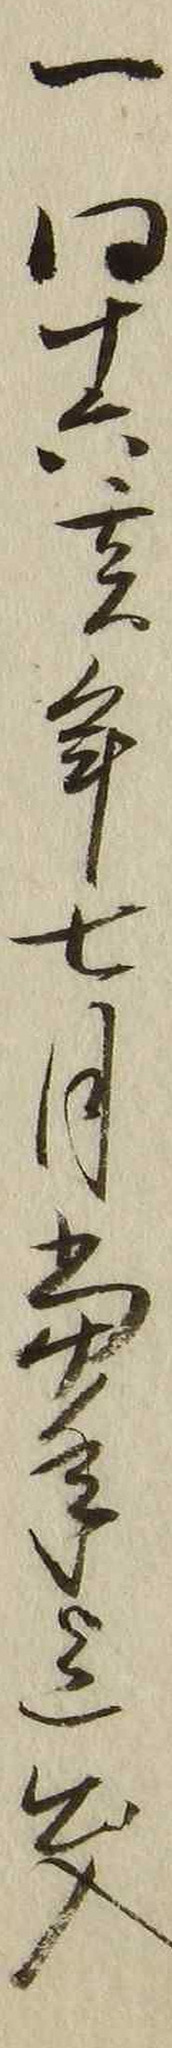一同十六亥年七月当年迄出入
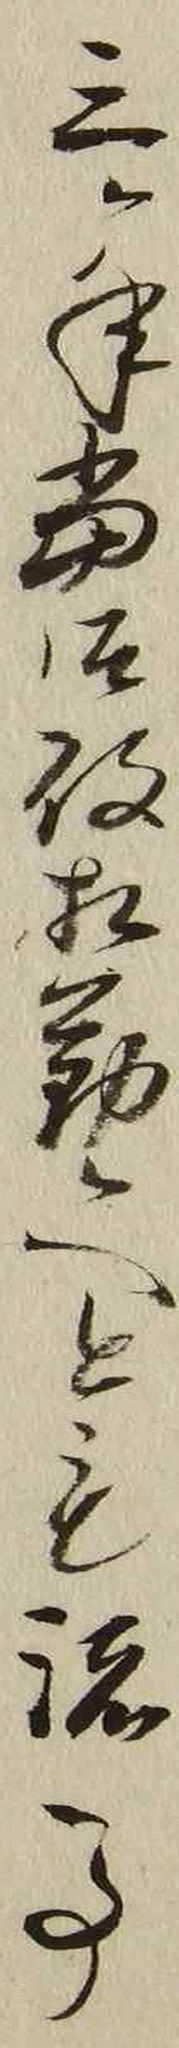三ヶ年当御役相勤候へとも諸事
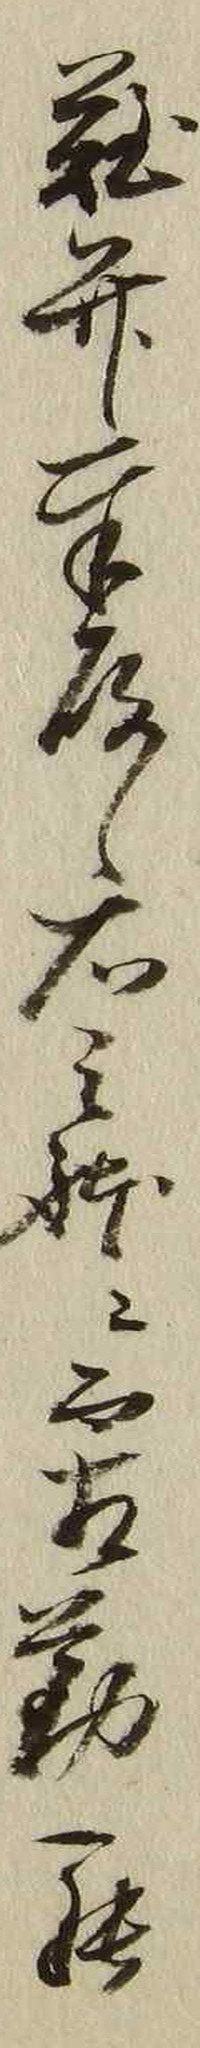難弁奉存候右之体ニ而相勤罷
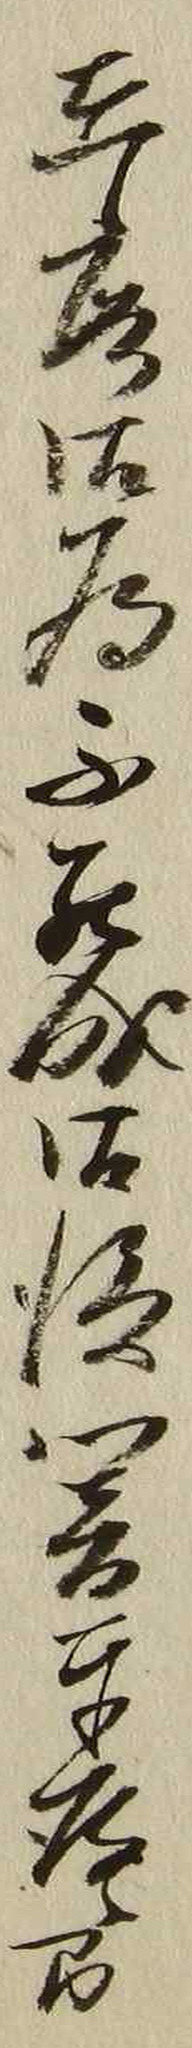在候段御為不罷成御役響奉存候間
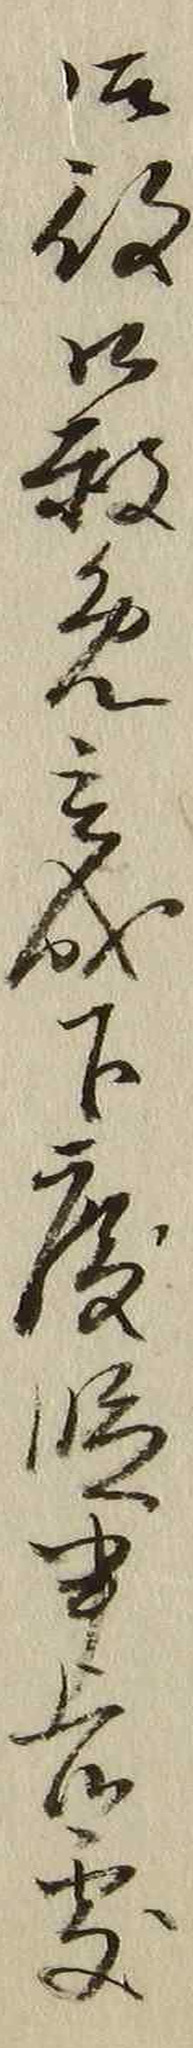御役御赦免被成下度段申上候処
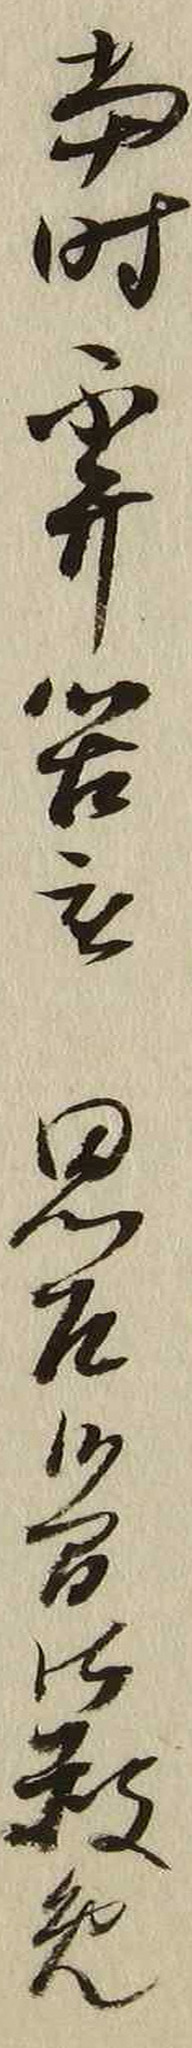当時不弁筈被思召候間御赦免
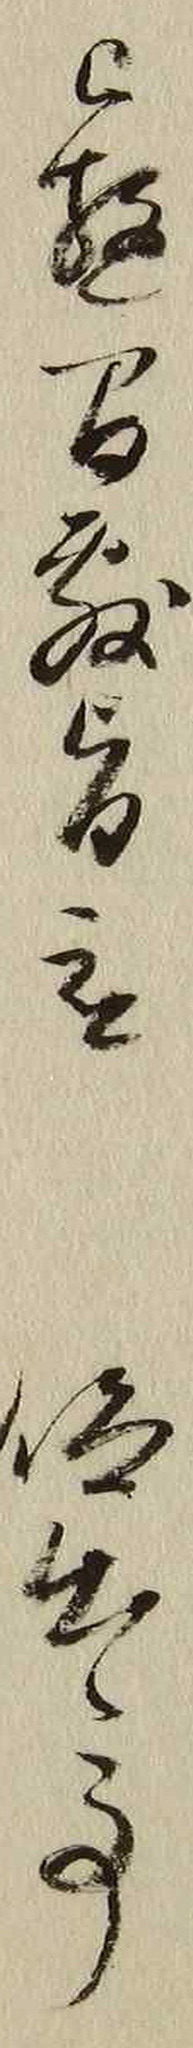被遊間敷旨被仰出候事
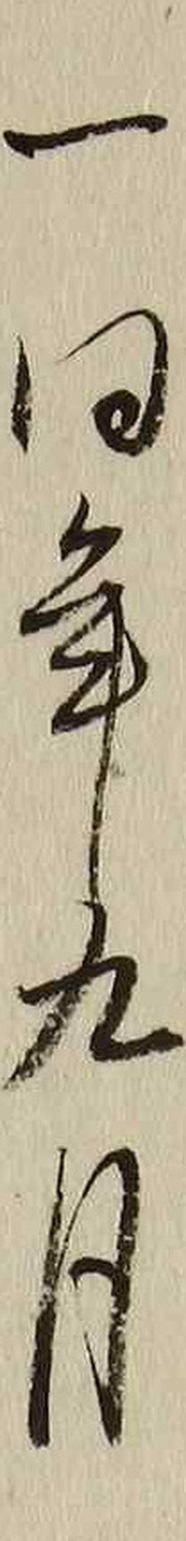一同年九月
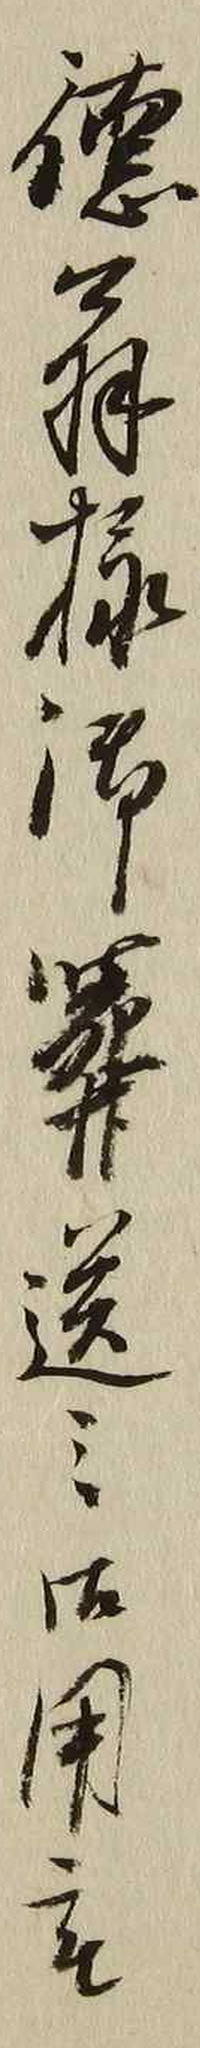徳翁様御葬送之御用被
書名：諸士系譜　巻之352　す之部2
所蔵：会津若松市立会津図書館
